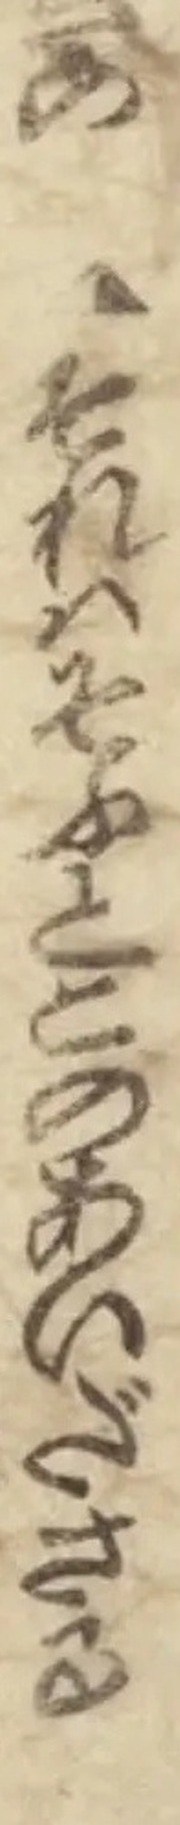▲それはそふとこのあいださる
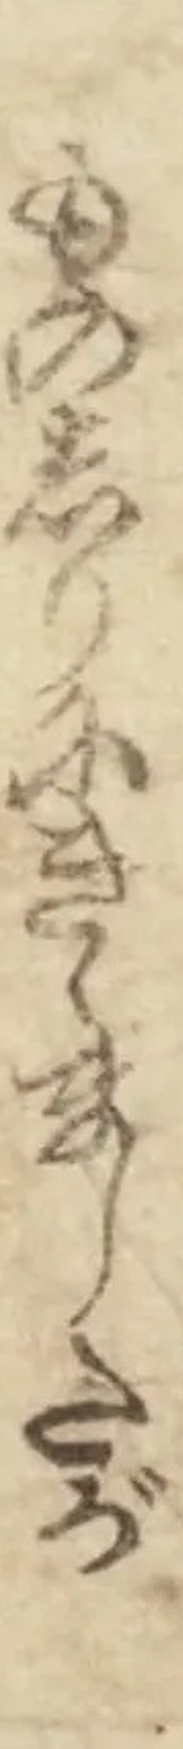ものしりにきゝましたが
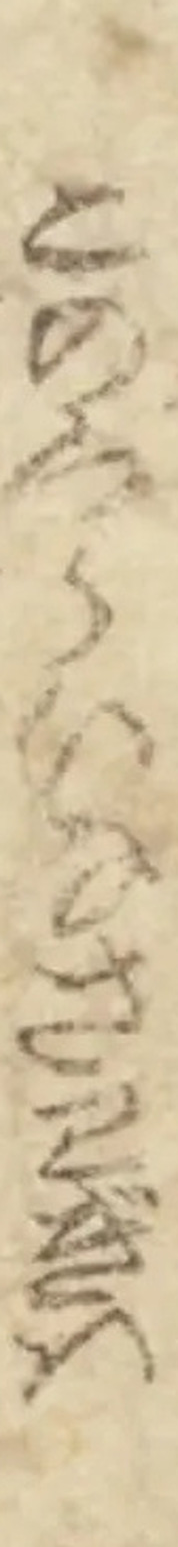このくらいなさわぎは
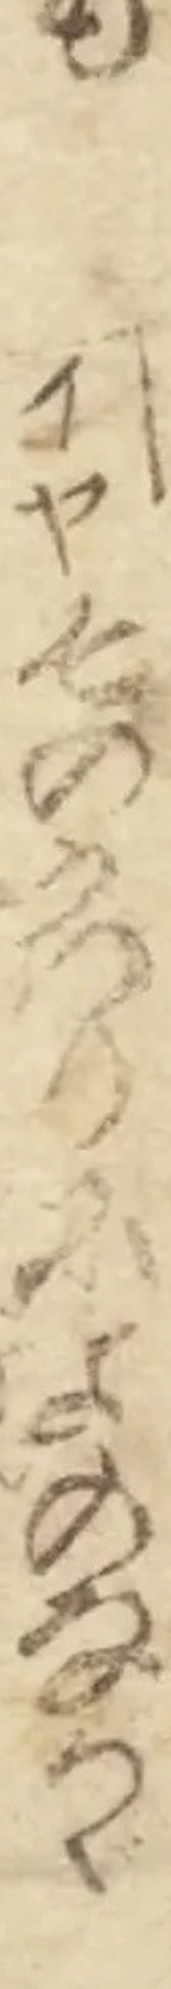「イヤそのかはりによのかかゞ
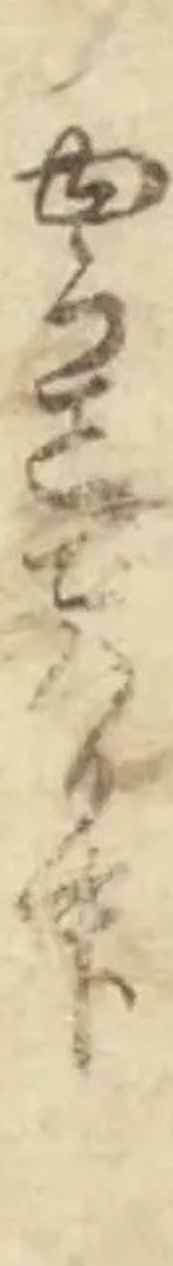ゆうことで厶り升
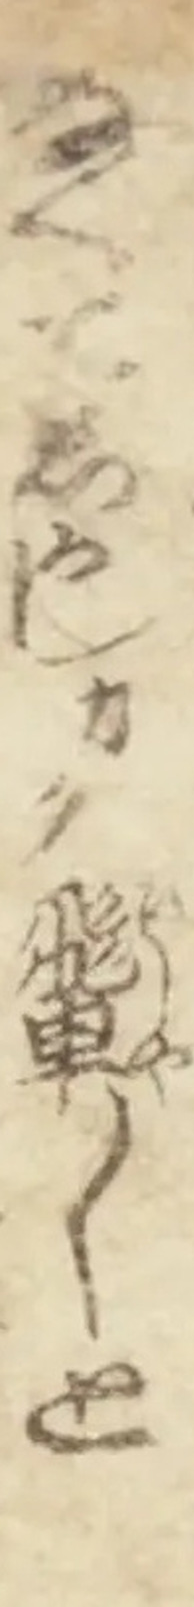なくてしかしカク飛車〳〵と
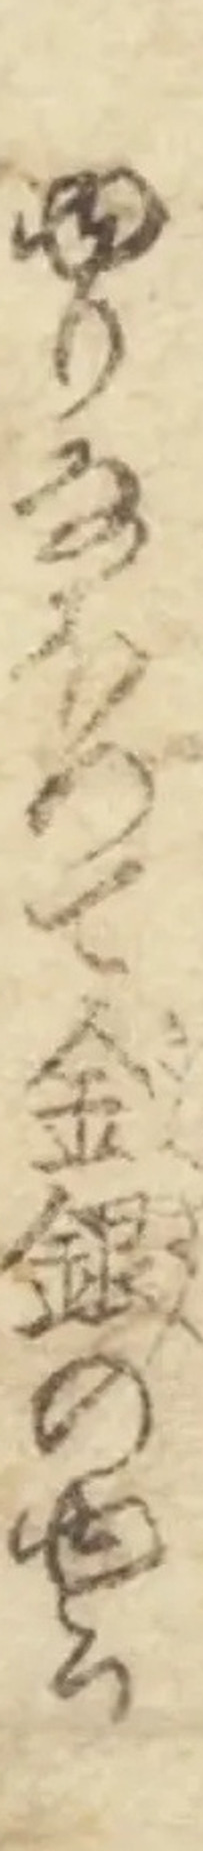ゆりなほつて金銀のゆう
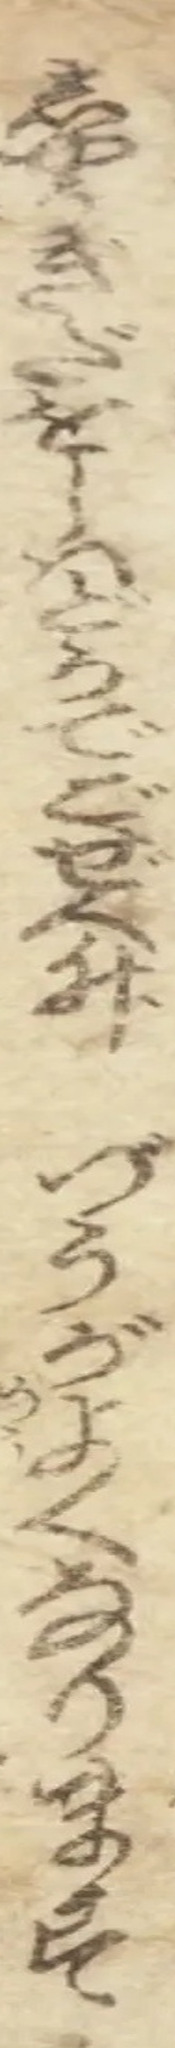しやうぎだをしはどうでごぜへ升
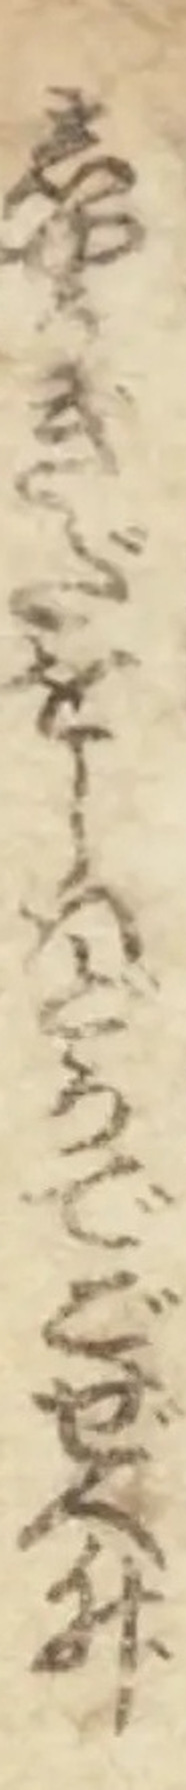しやうぎだをしはどうでごぜへ升
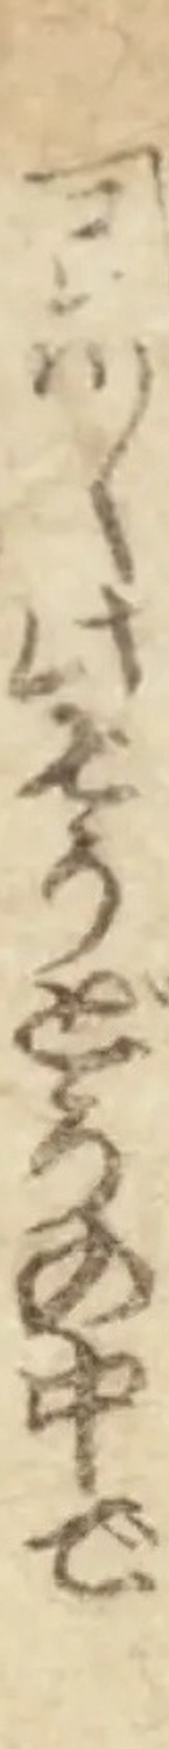「コレハ〳〵此そうどうの中で
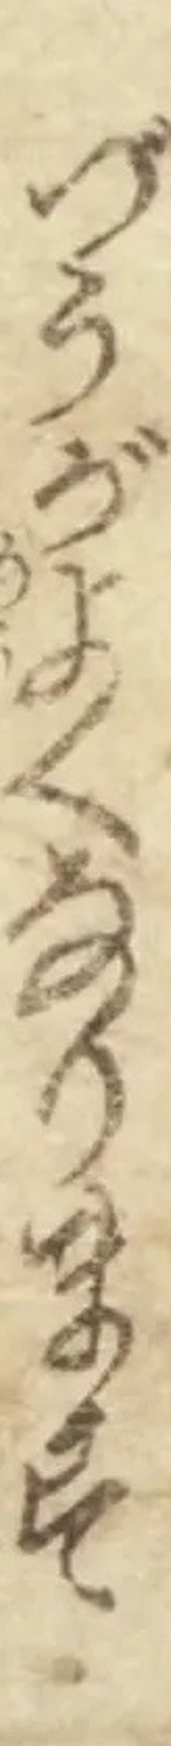づうがよくなります
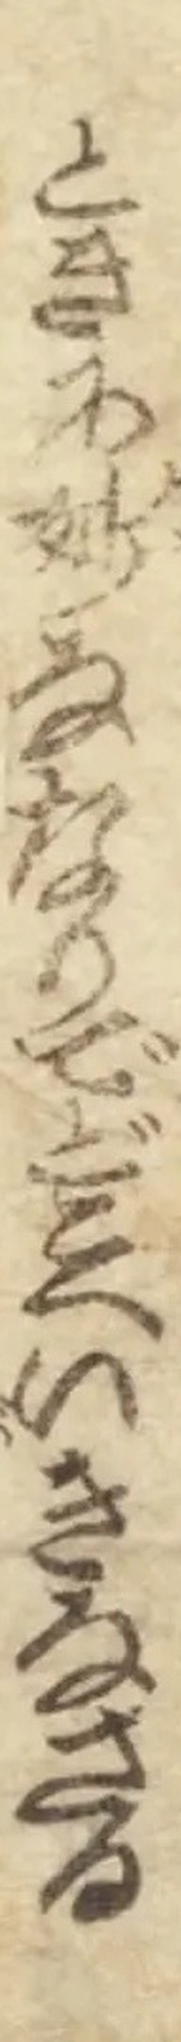ときに妙ななりでどこへいきなさる
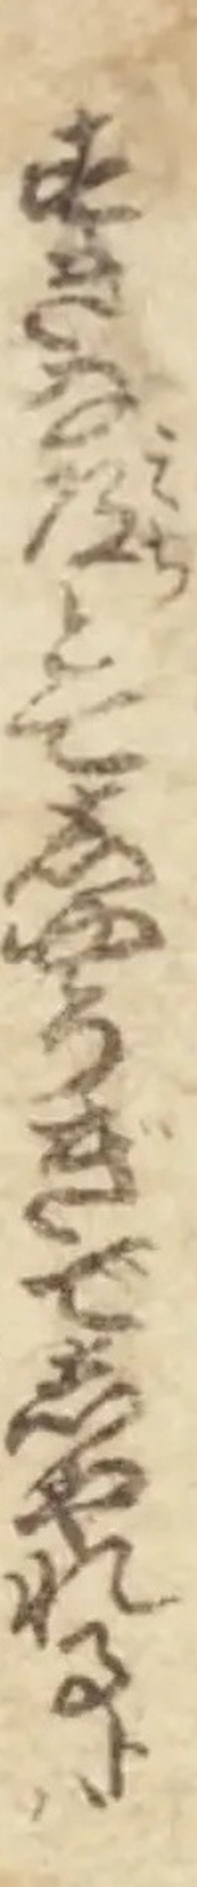すきな道とてしやうぎでしやれるトハ
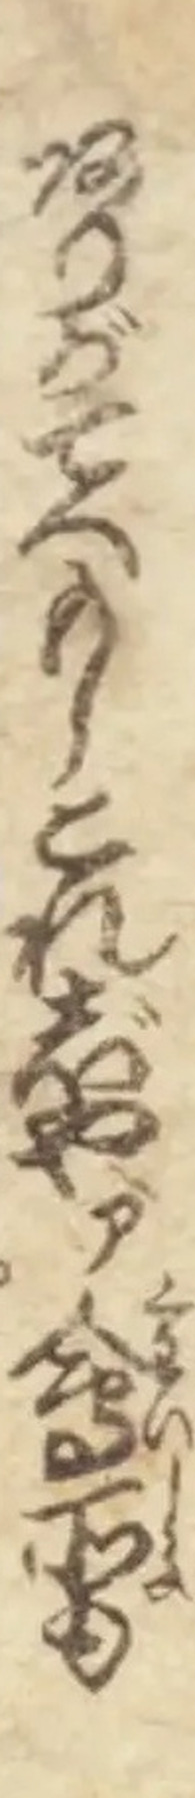ありがてへもしこれじやア会所も
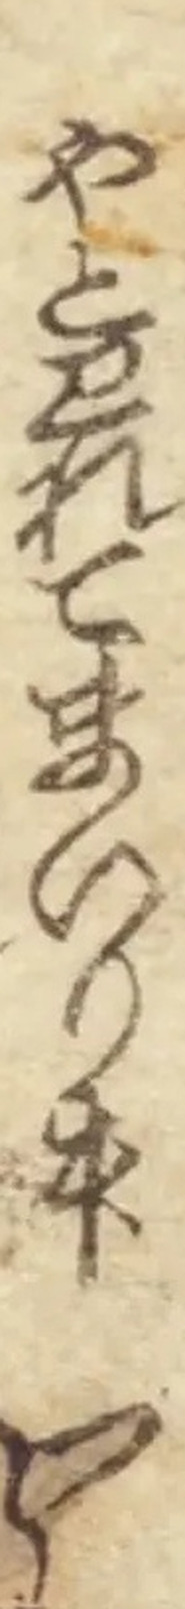やとわれてまいり升
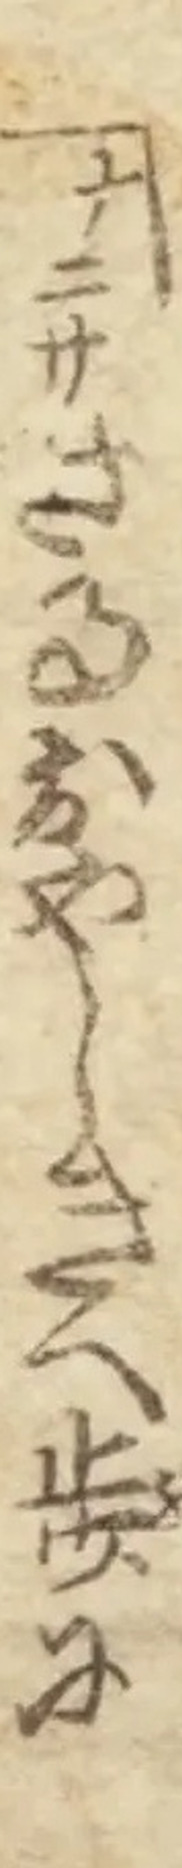「ナニサさるおやしきへ歩に
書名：二日はなし地震亭念魚町々庵炎上
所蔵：国立国会図書館 National Diet Library, JAPAN
